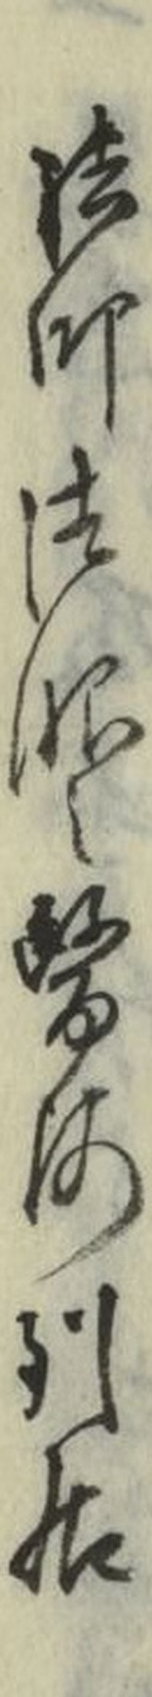法印法眼之医師列居
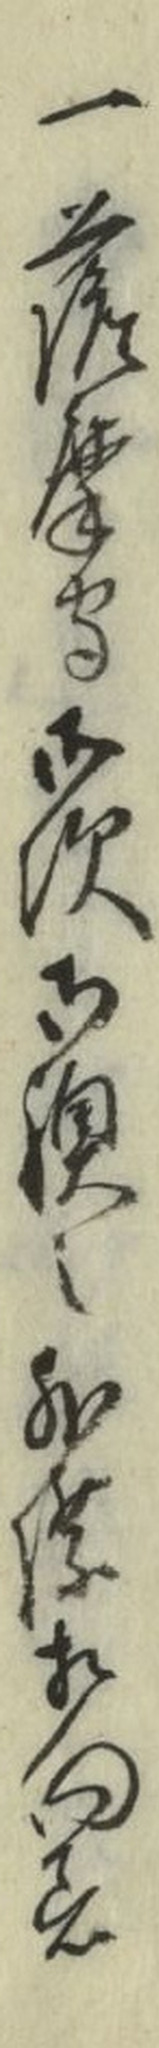一薩摩守御次御襖之外際相向着

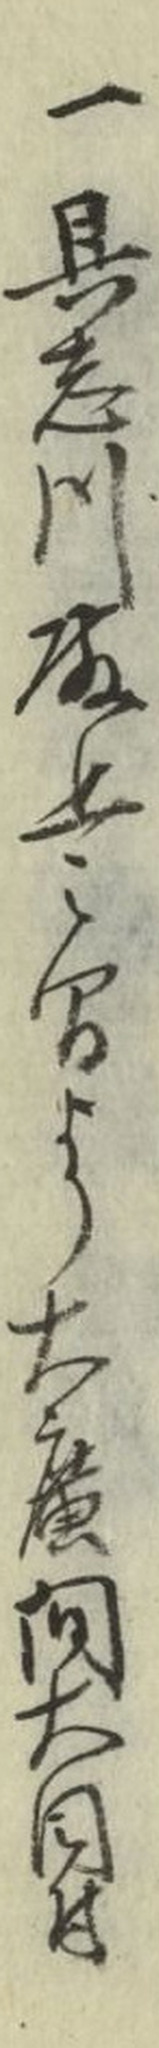一具志川殿上之間より大広間大目付
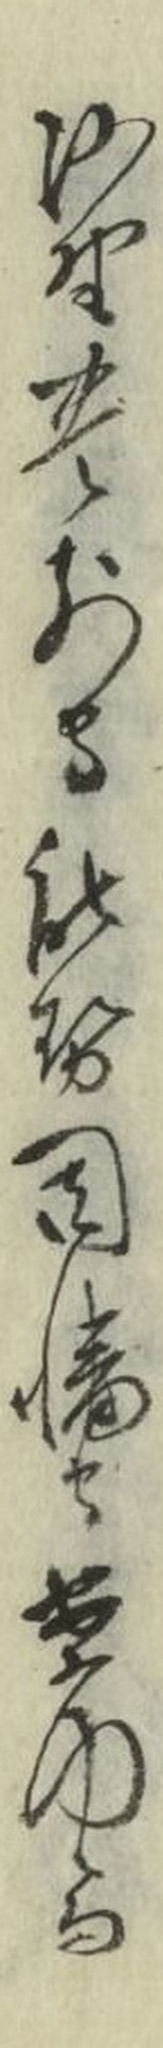河野豊前守能勢因幡守案内に而
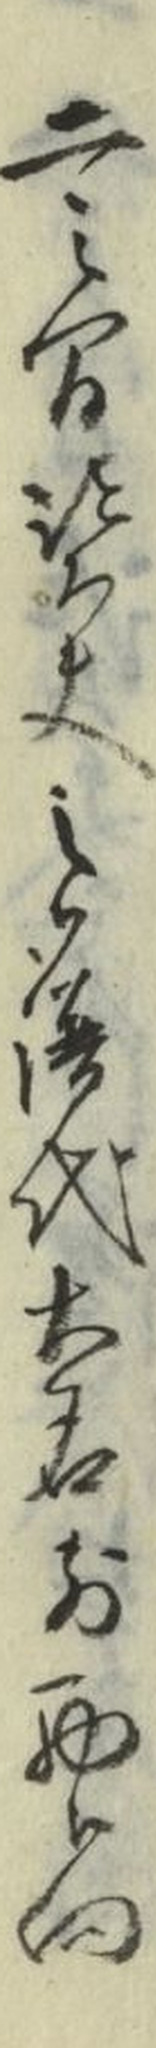二之間諸大夫之御譜代大名前西え向
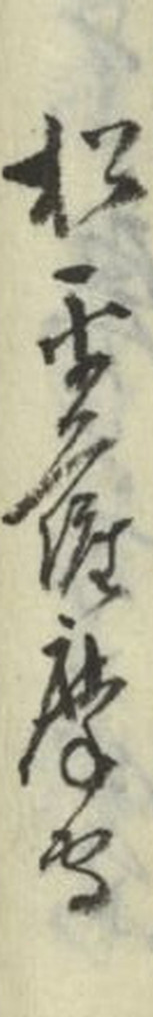松平薩摩守
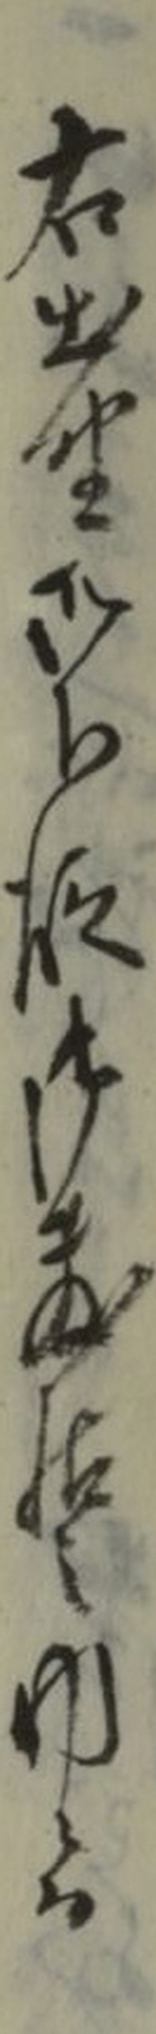右出坐御下段御敷居之内に而
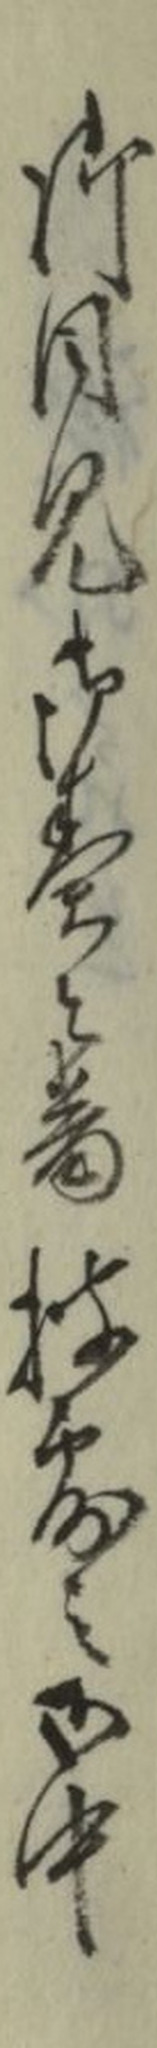御目見御奏者番披露之御中
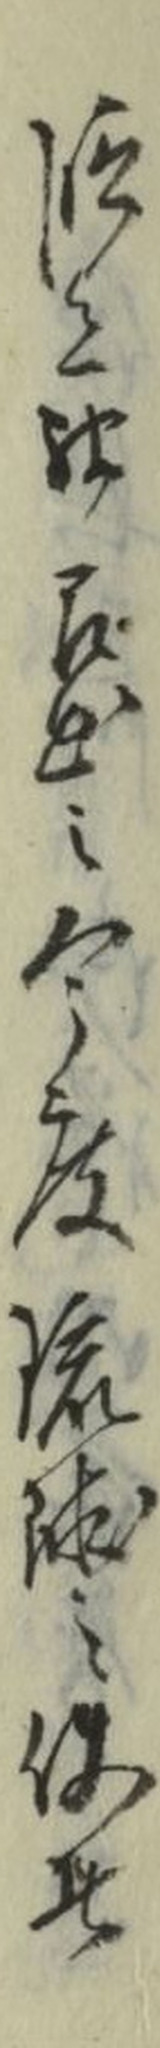段迄被召出之今度琉球之使者
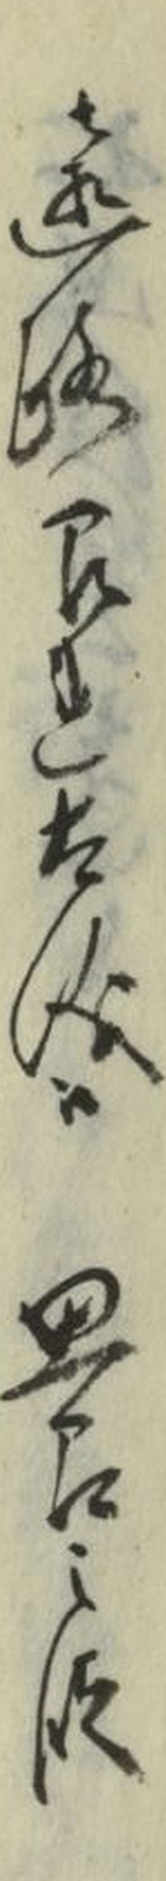遠路召連太義被思召之段
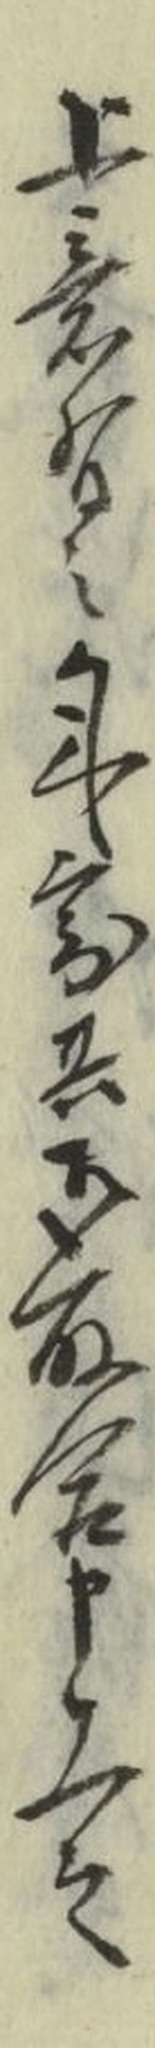上意有之年寄共御取合申上之
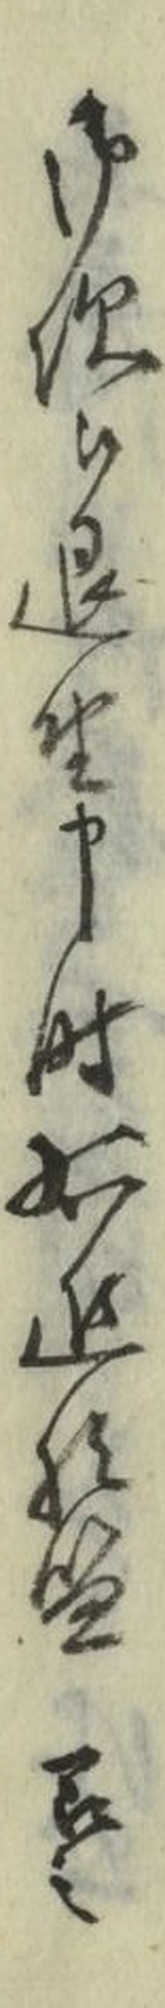御次え退坐申時右近将監召之

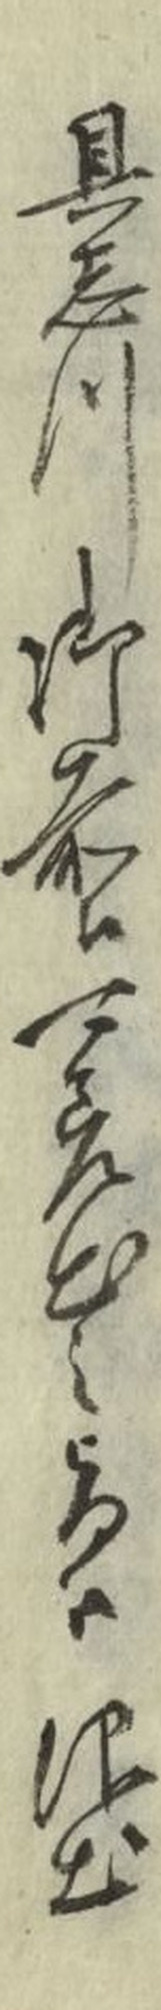具志川御前え可差出之旨被仰出
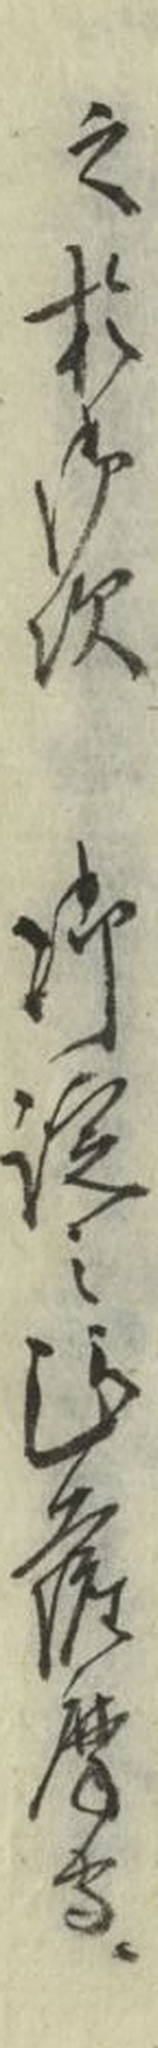之於御次御諚之趣薩摩守に
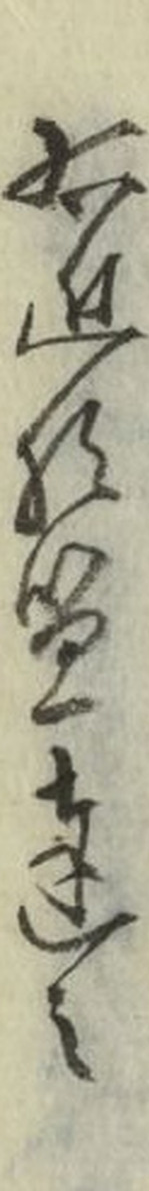右近将監達之
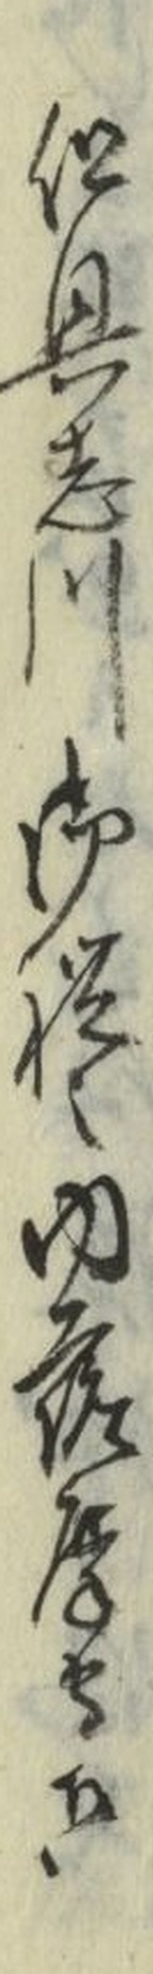但具志川御礼之内薩摩守御
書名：琉球人来朝記 一之二
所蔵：University of the Ryukyus Library
